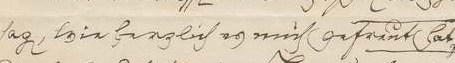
sagen, wie herzlich es mich gefreut hat,
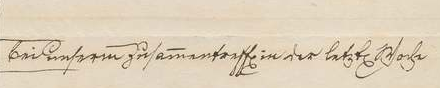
bei unserm Zusammentreffen in der letzten Woche
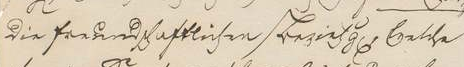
die freundschaftlichen Beziehungen, welche
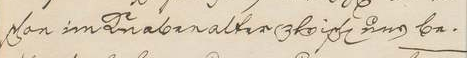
schon im Knabenalter zwischen uns be-
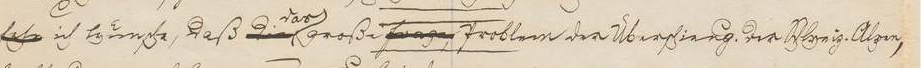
angelegentlich ich wünsche, daß diedas große FrageProblem der Überschieng. der Schweiz. Alpen,
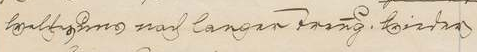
welches uns nach langer Trenng. wieder
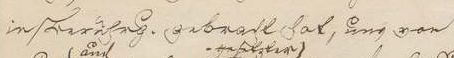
in Berührg. gebracht hat, uns von
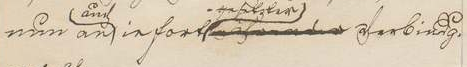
an auch in fortwährendergesetzter Verbindg.
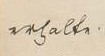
erhalte.
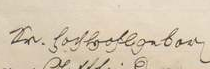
Sr. Hochwohlgeboren
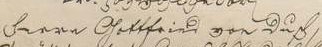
Herrn Gottfried von Dusch,
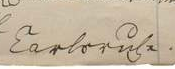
Carlsruhe.
